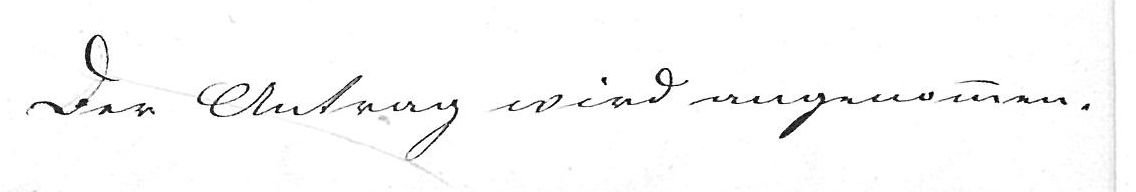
Der Antrag wird angenommen.
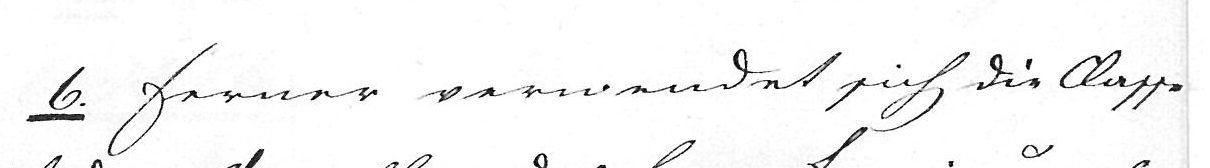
b. Ferner verwendet sich die Classe
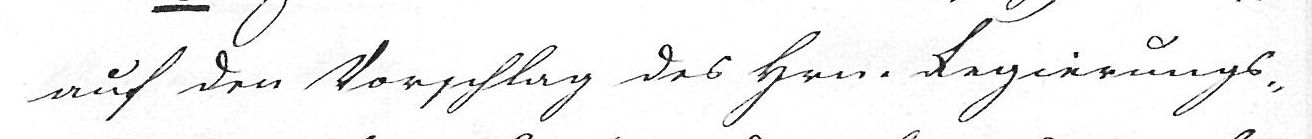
auf den Vorschlag des Hrn. Regierungs-
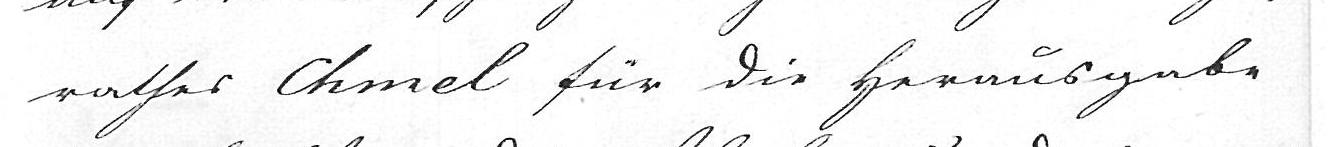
rathes Chmel für die Herausgabe
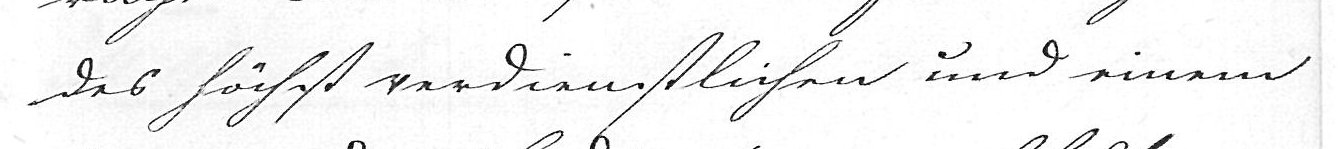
des höchst verdienstlichen und einem
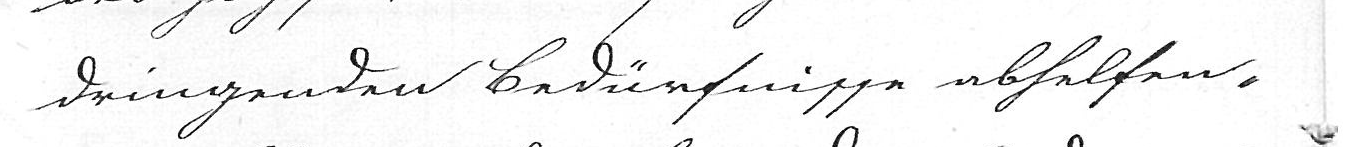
drigenden Bedürfnisse abhelfen-
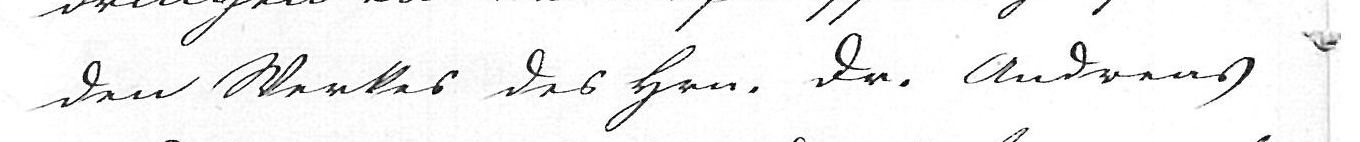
den Werken des Hrn. Dr. Andreas
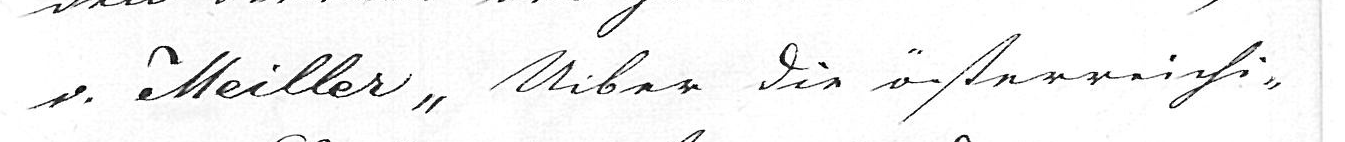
v. Meiller "Uiber die osterreichi-
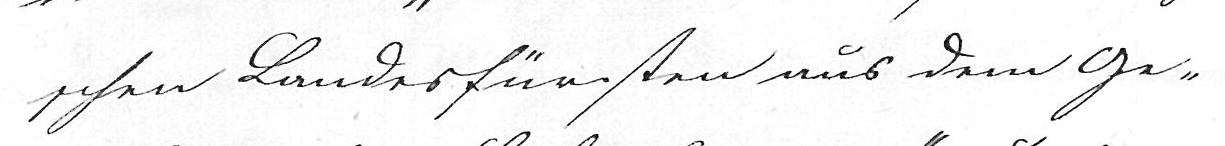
schen Landesfürsten aus dem Ge-
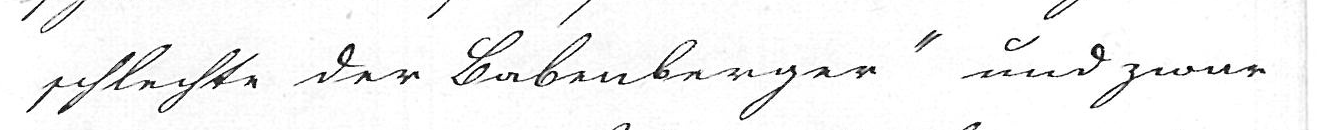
schlechte der Babenberger" und zwar
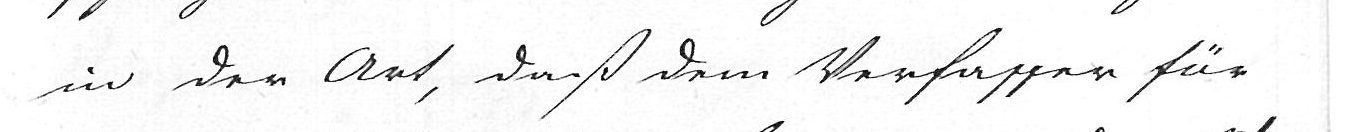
in der Art, daß dem Verfasser für
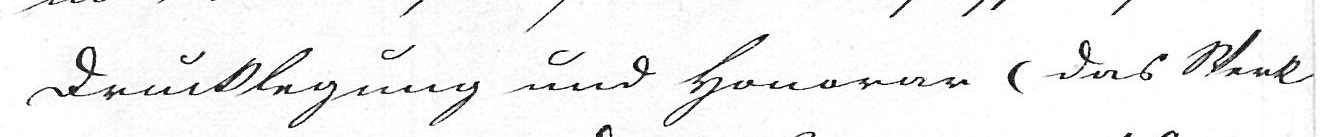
Drucklegung und Honorar (das Werk
